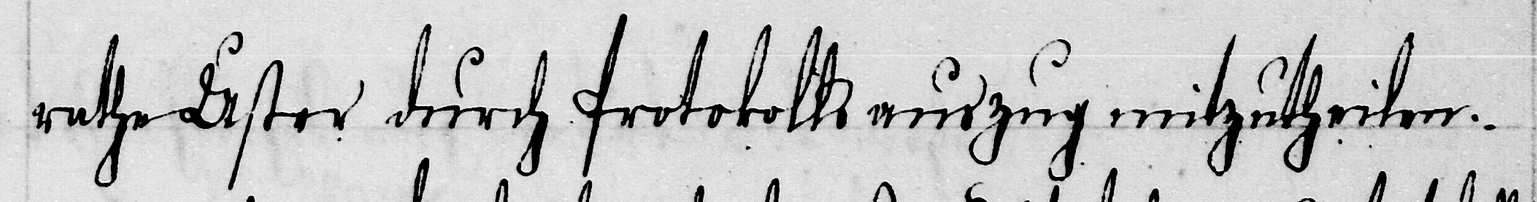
rathe Uster durch Protokollsauszug mitzutheilen.
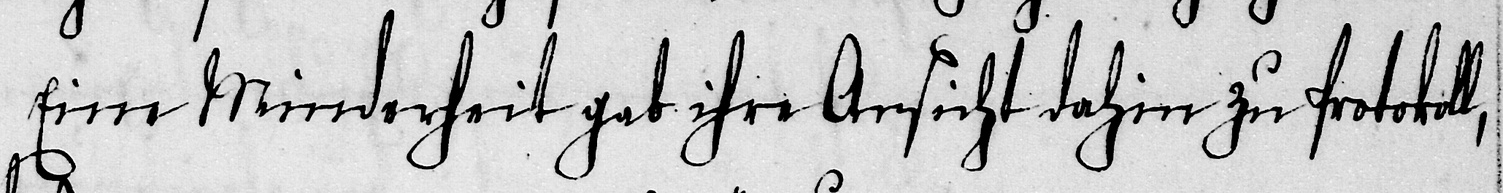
Eine Minderheit gab ihre Ansicht dahin zu Protokol¬
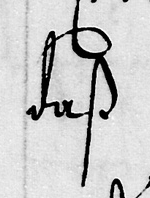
daß
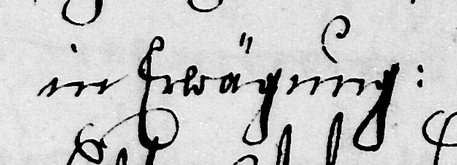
in Erwägung:
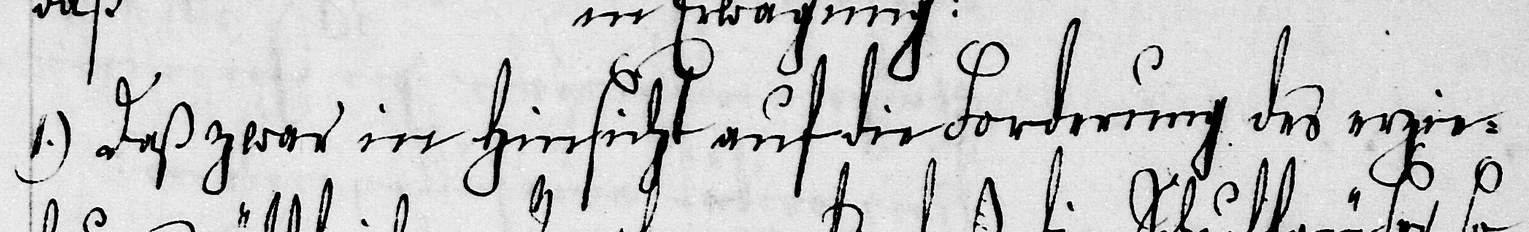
1.) Daß zwar in Hinsicht auf die Forderung des erzie¬
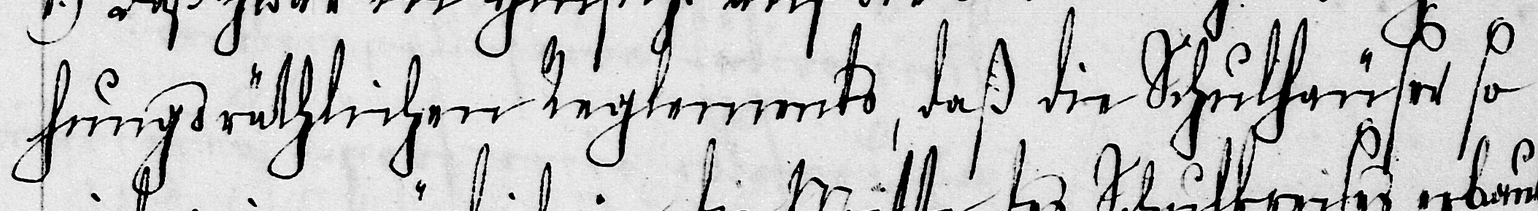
hungsräthlichen Reglements, daß die Schulhäuser so
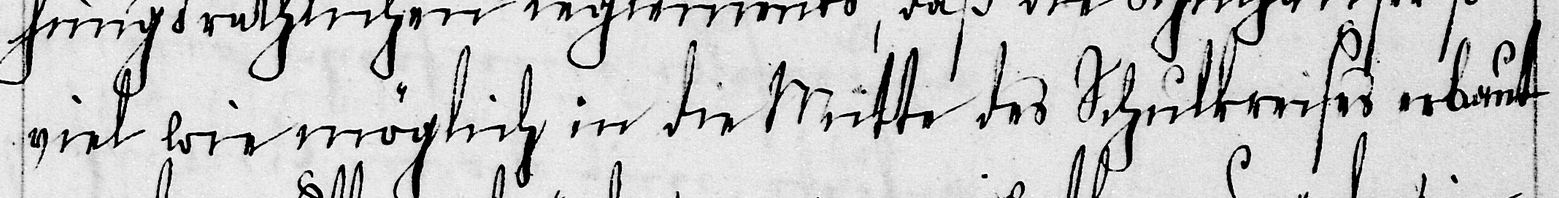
viel wie möglich in die Mitte des Schulkreises erbaut
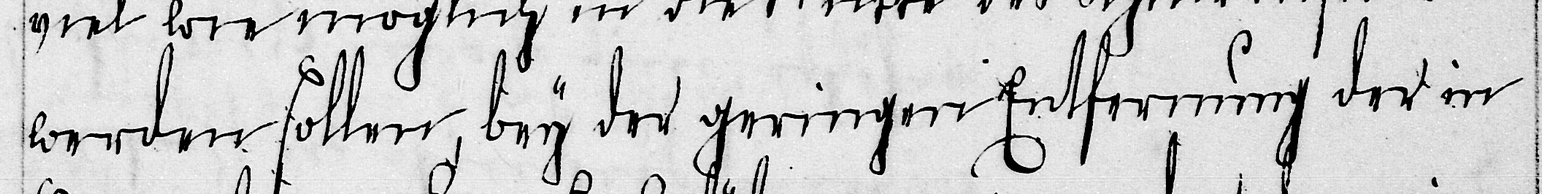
werden sollen, bey der geringen Entfernung der in
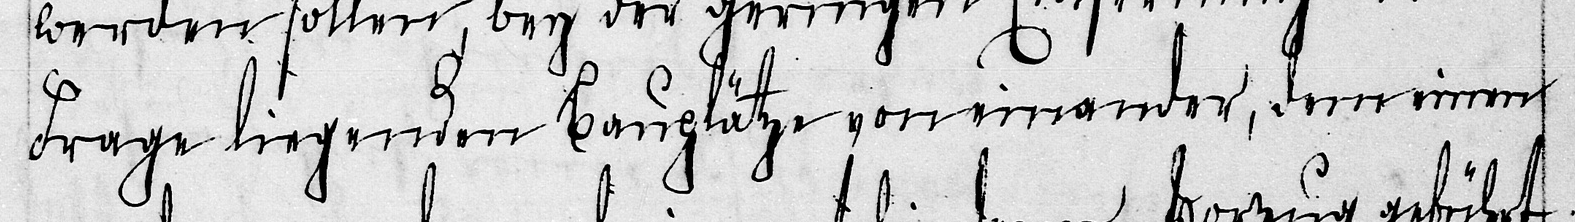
Frage liegenden Bauplätze von einander, dem einen
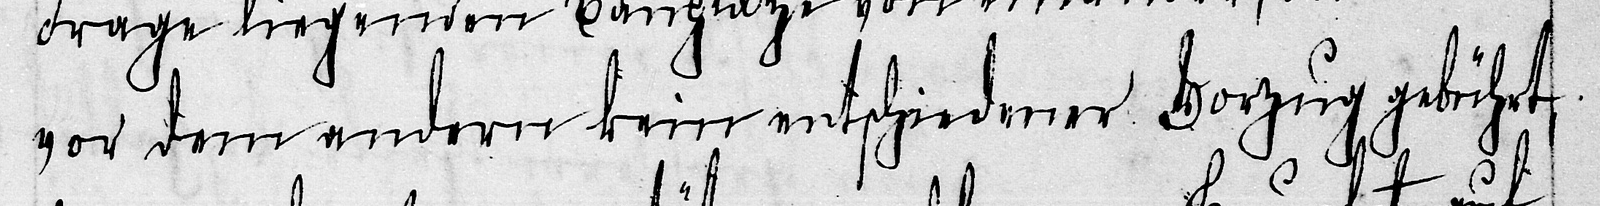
vor dem andern kein entschiedener Vorzug gebührt,
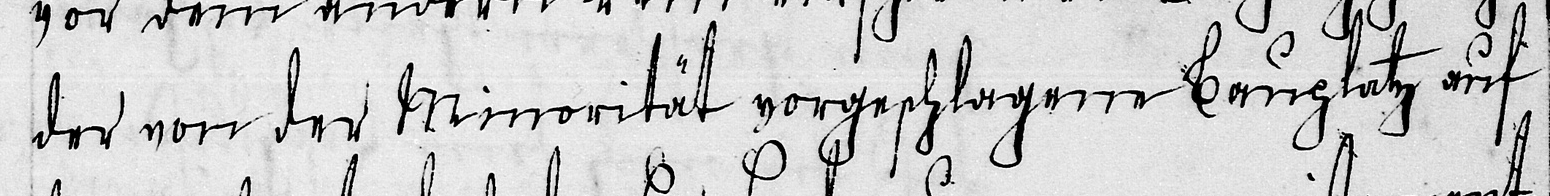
der von der Minorität vorgeschlagene Bauplatz auf
